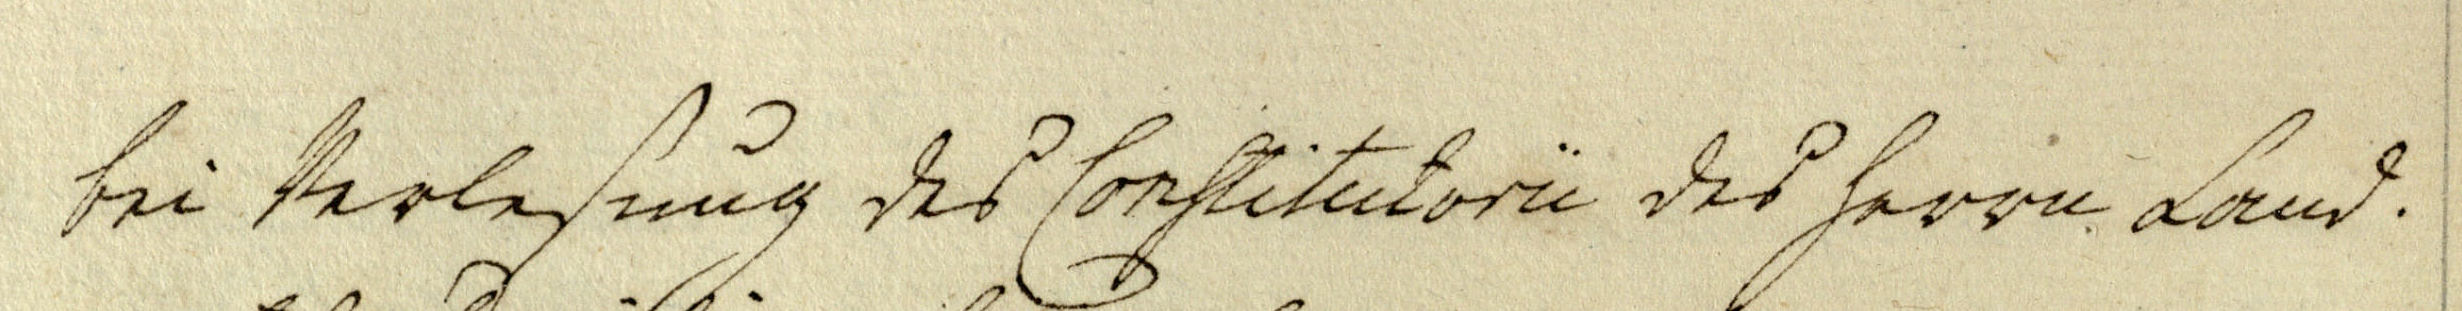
bei Verlesung des Constitutorii des Herrn Land¬
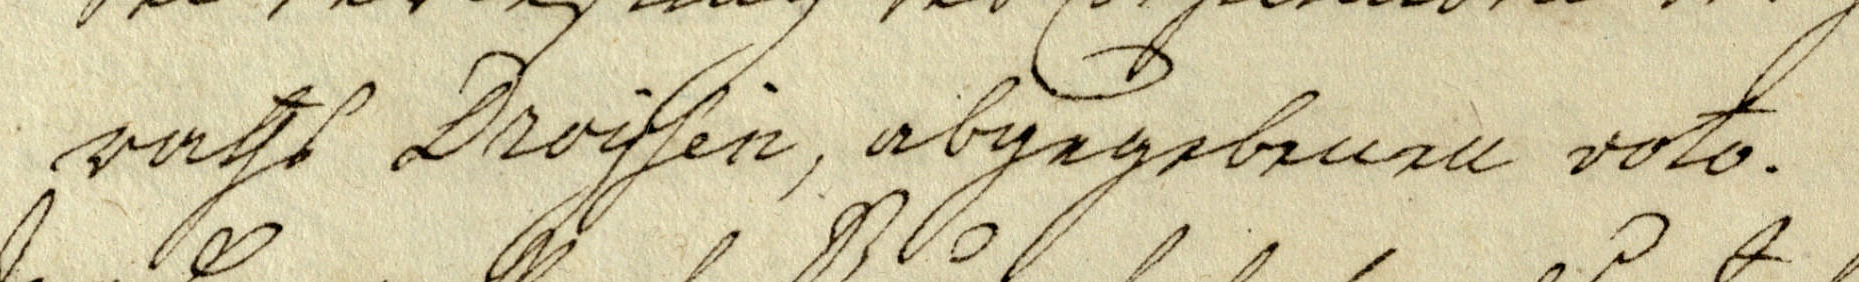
raths Droÿsen, abgegebenen voto.
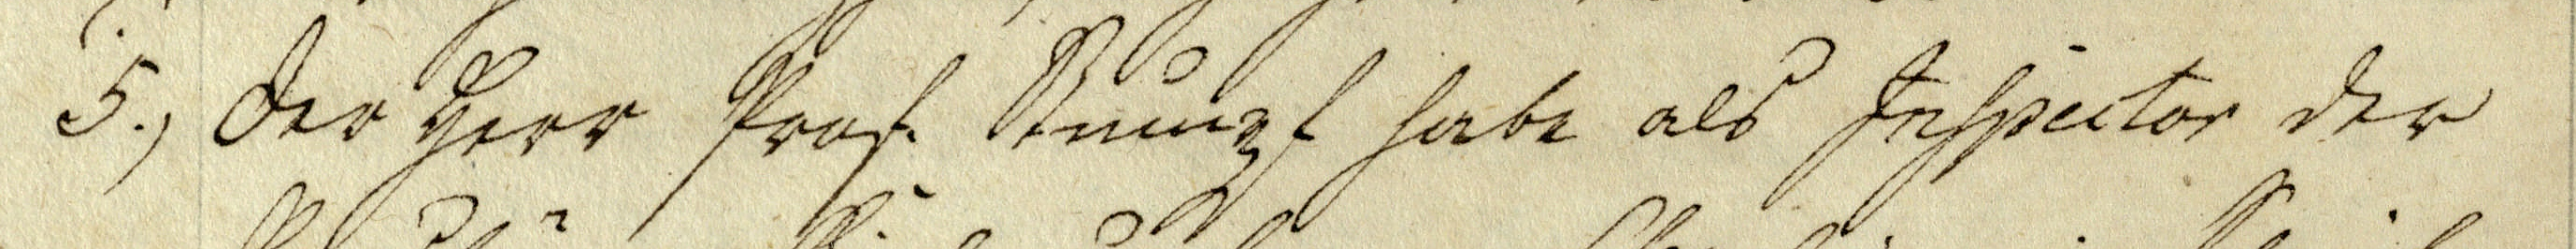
5., Der Herr Prof. Stumpf habe als Inspector der
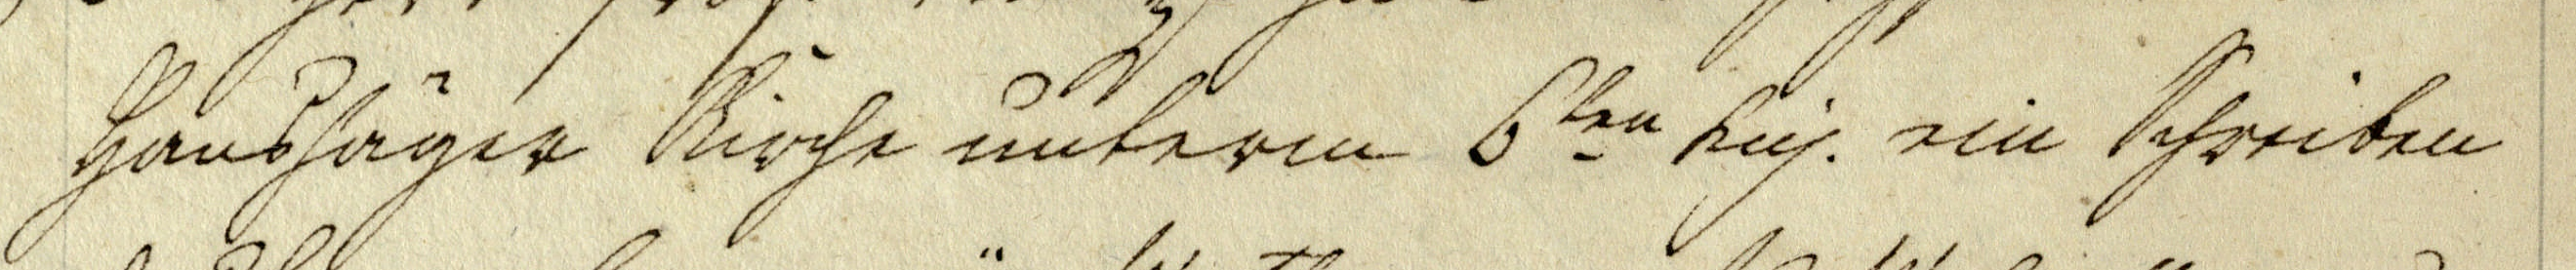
Hanshäger Kirche unterm 6 ten huj. ein Schreiben
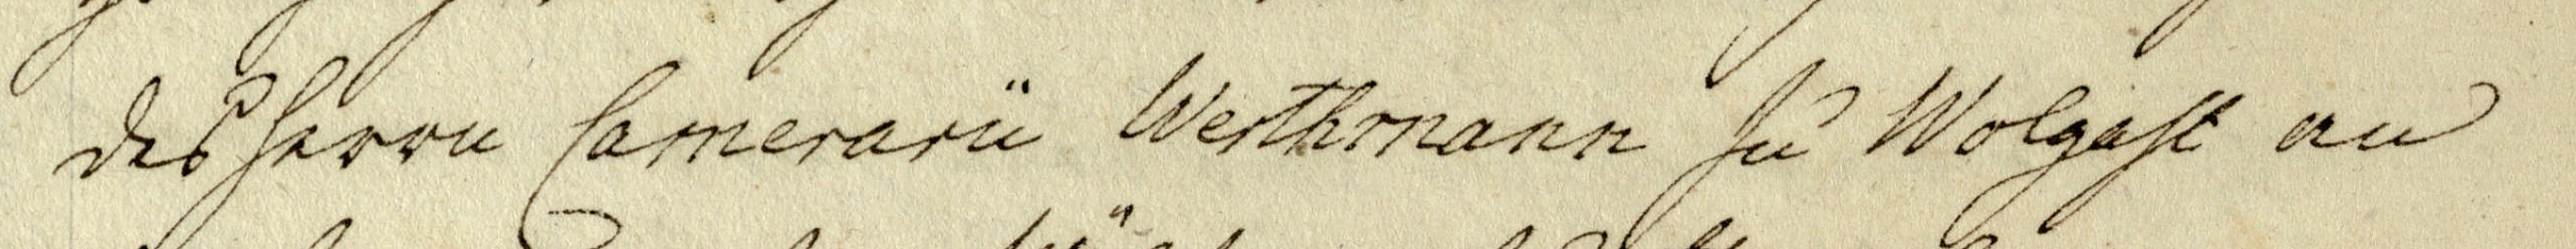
des Herrn Camerarii Werthmann zu Wolgast an
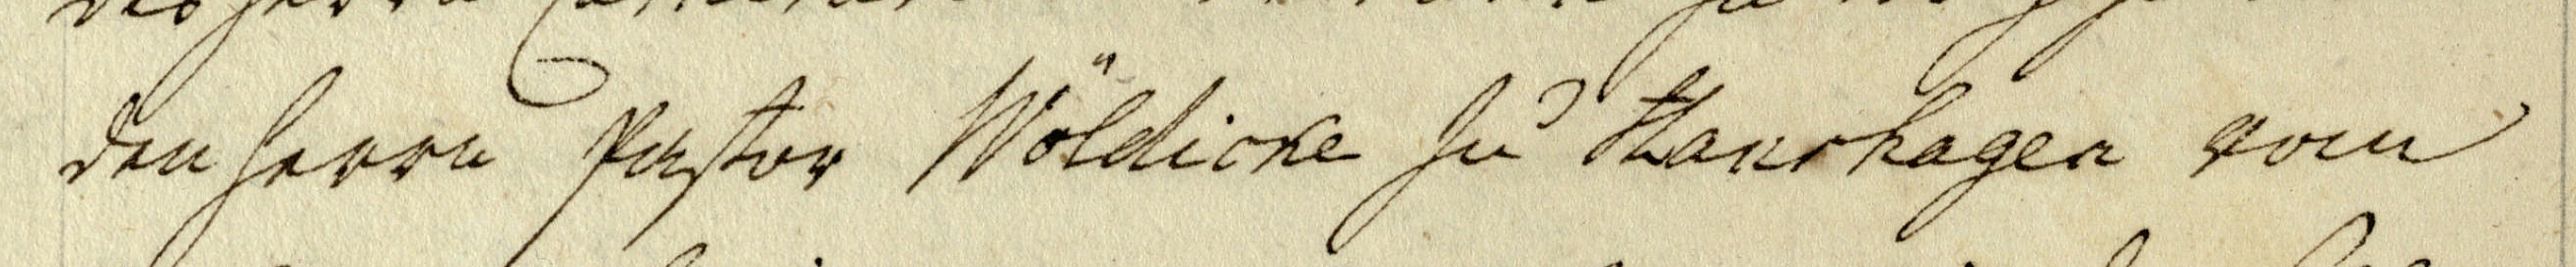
den Herrn Pastor Wöldicke zu Hanshagen vom
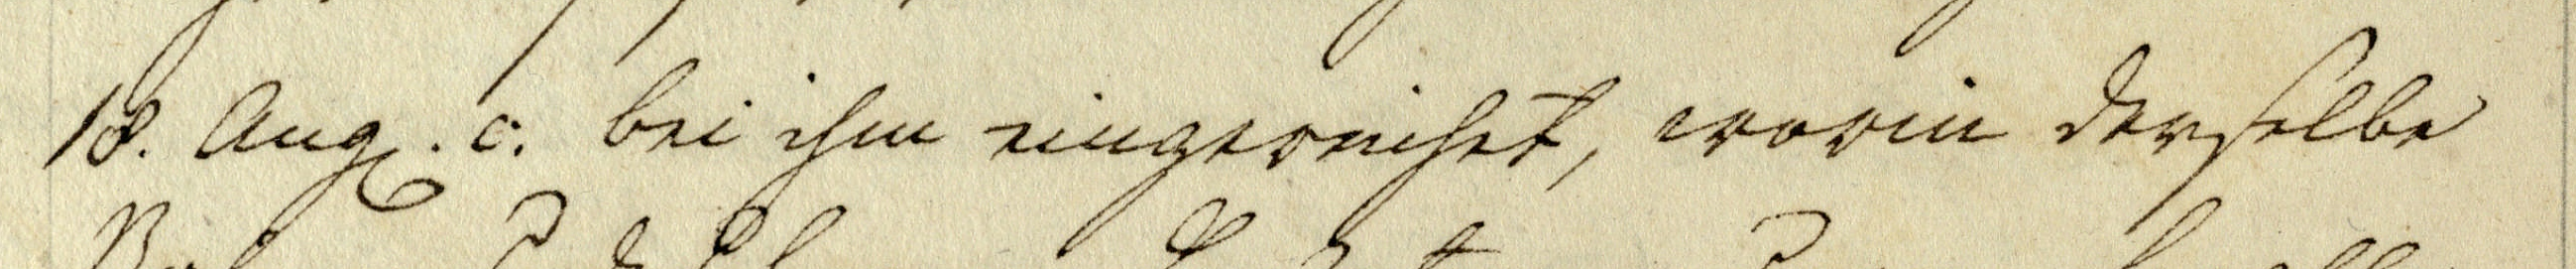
18. Aug. c. bei ihm eingereichet, worin derselbe
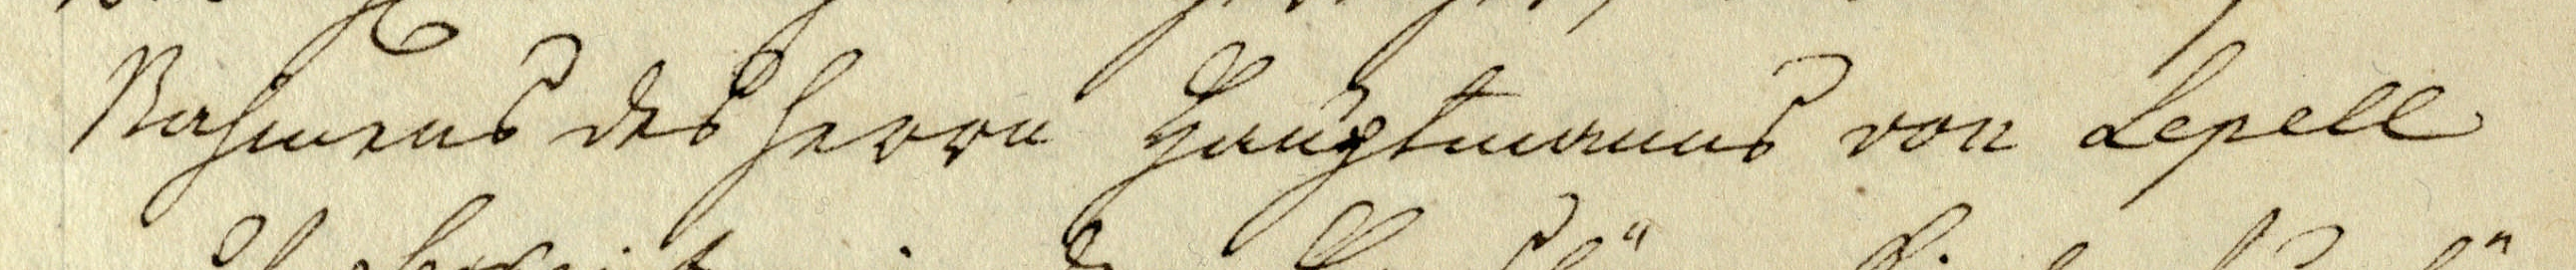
Nahmens des Herrn Hauptmanns von Lepell
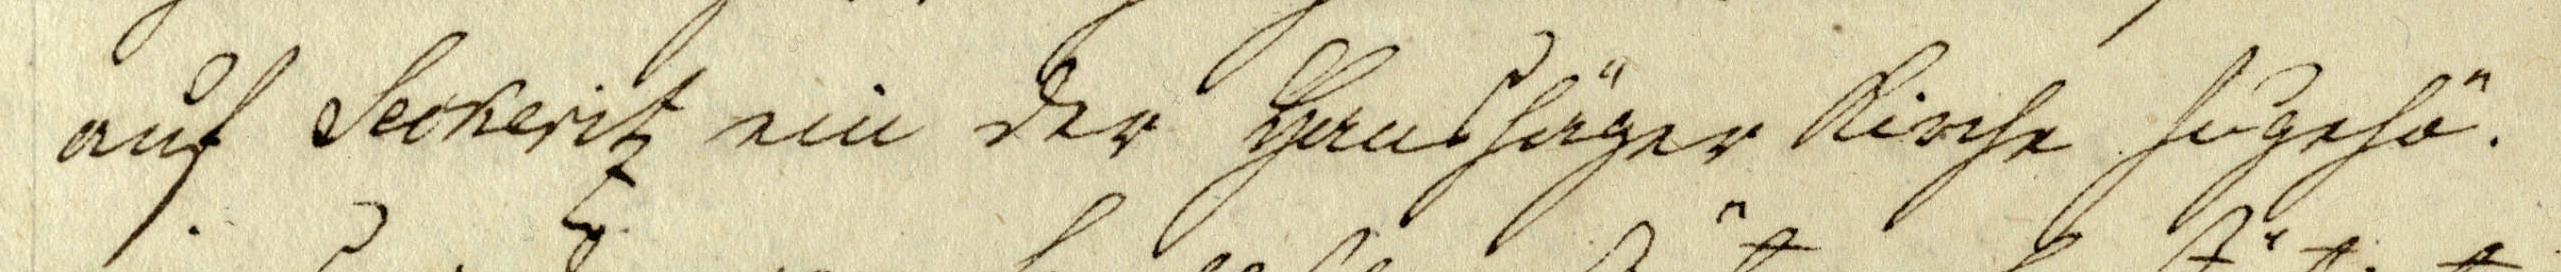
auf Seckeritz ein der Hanshäger Kirche zugehö¬
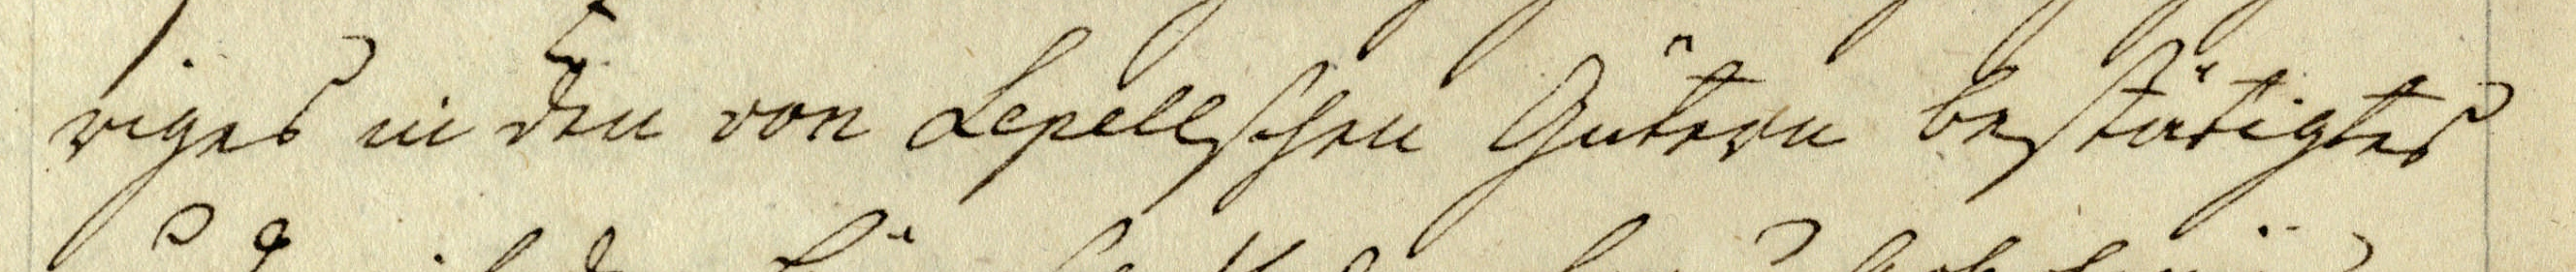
riges in den von Lepellschen Gütern bestätigtes
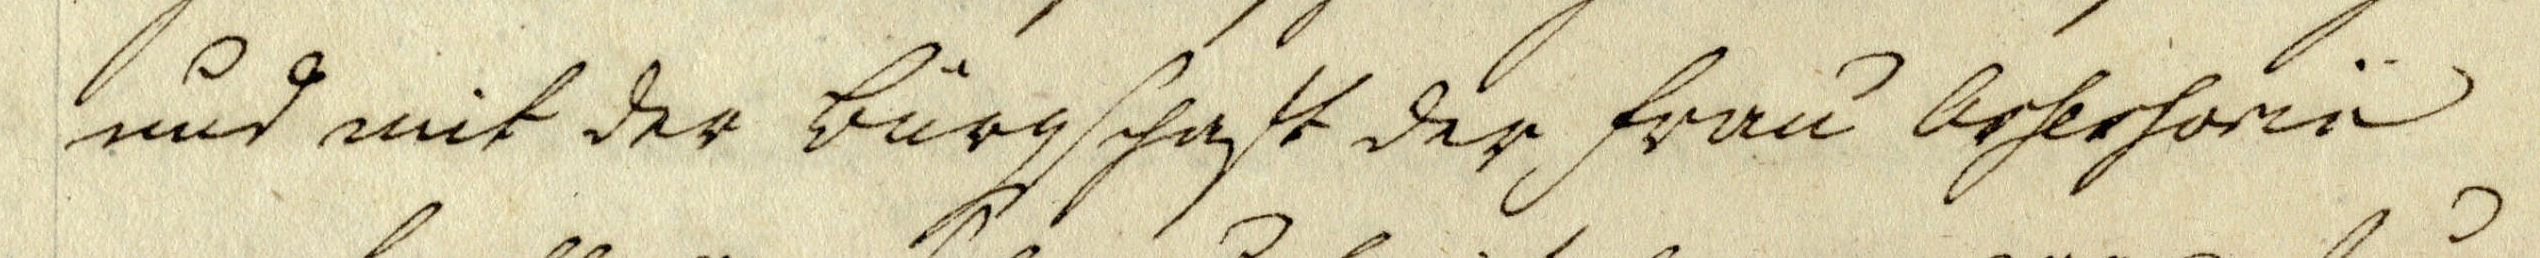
und mit der Bürgschaft der Frau Assessorin
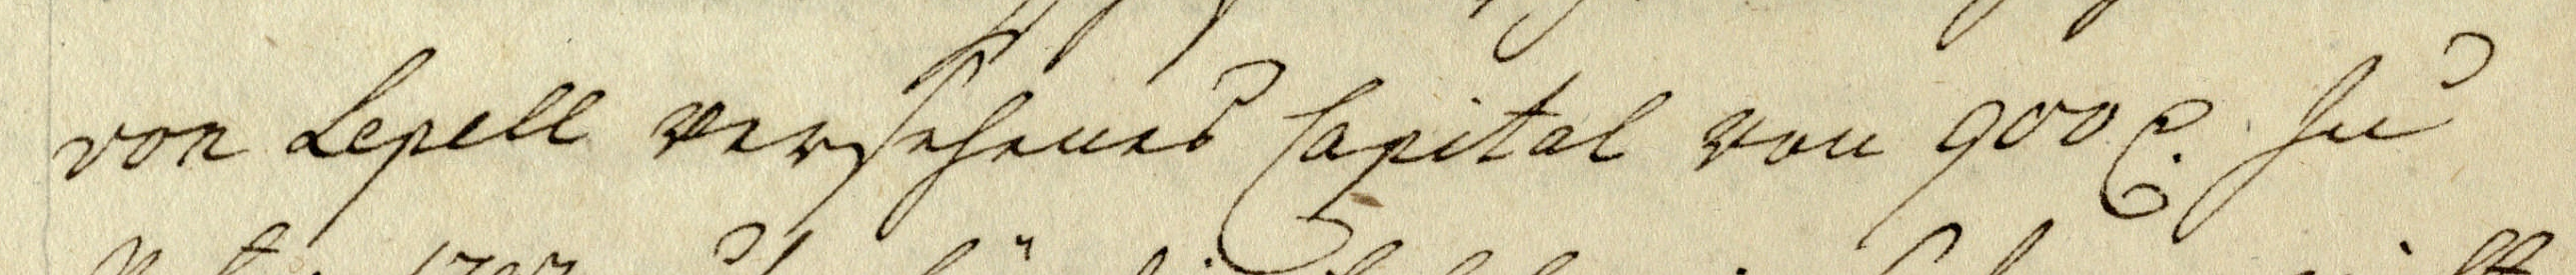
von Lepell versehenes Capital von 900 l. zu
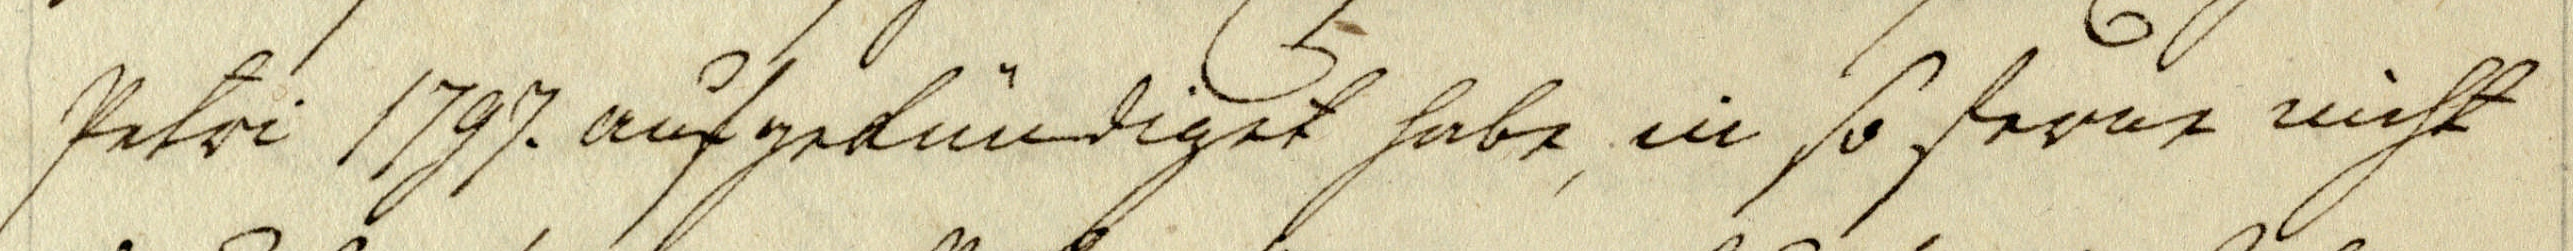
Petri 1797. aufgekündiget habe, in so ferne nicht
